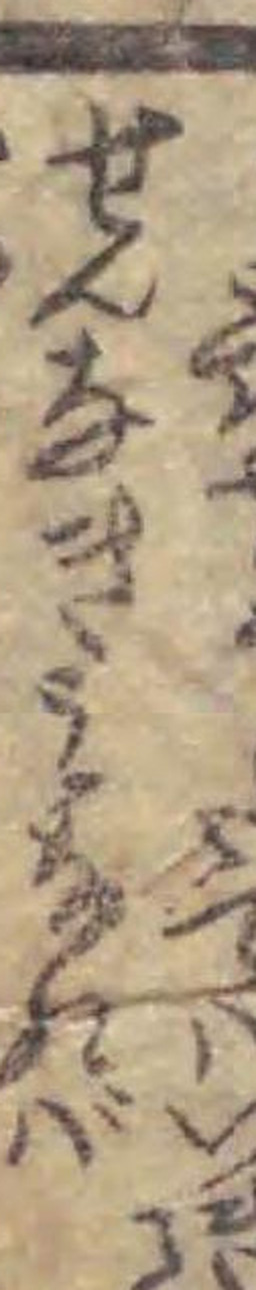せんなきみなれば
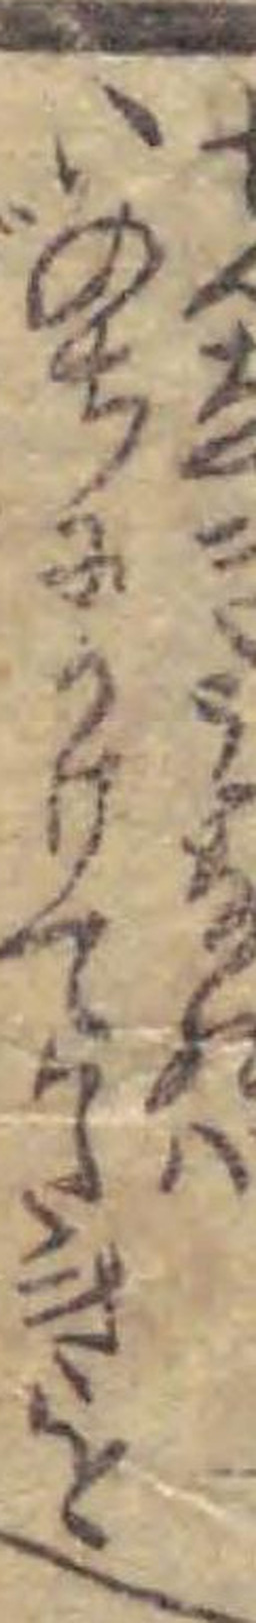いのちにかけてかたきを
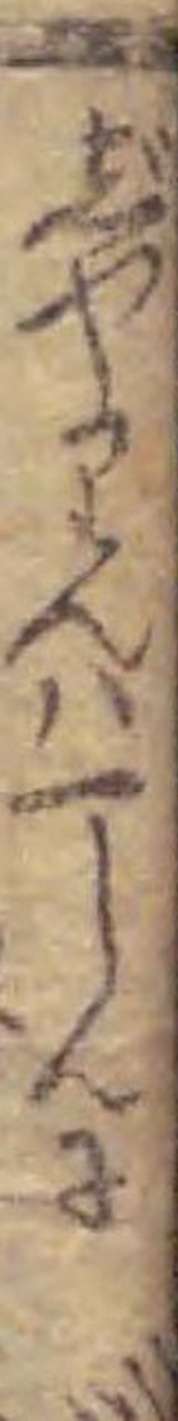じやりんは一しんに
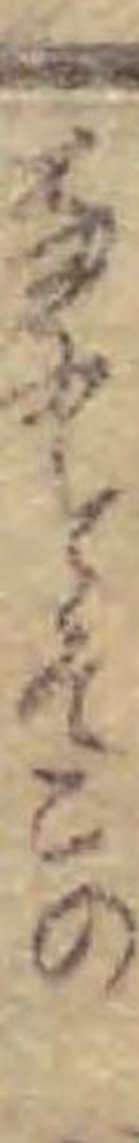なにとそこの
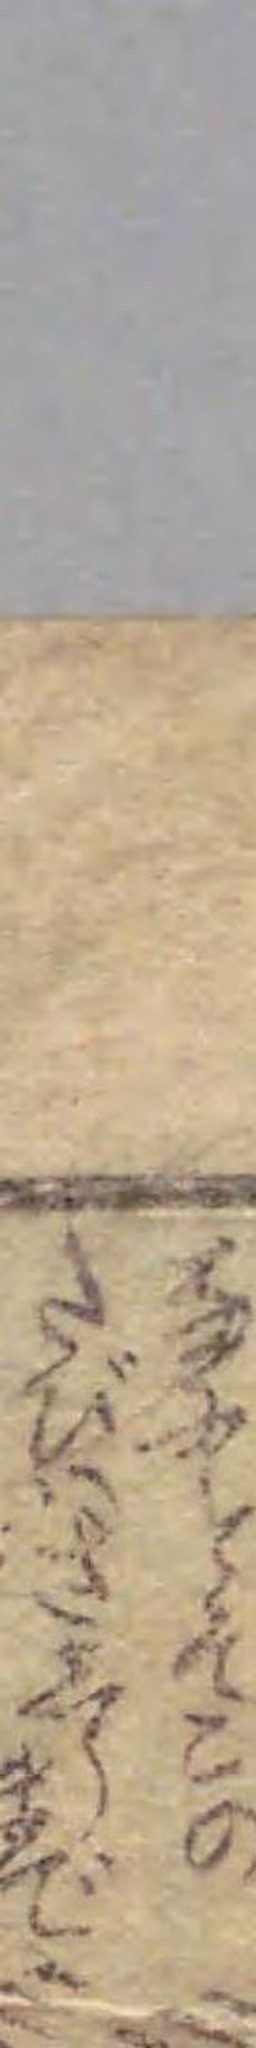たびはさしうまで
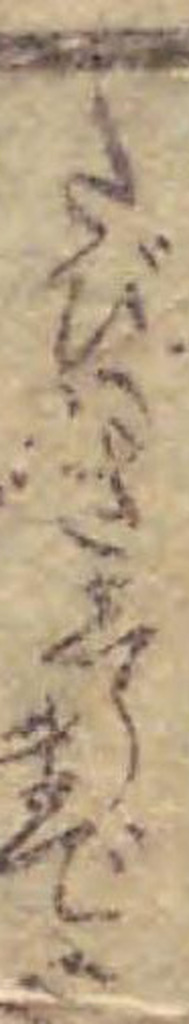たびはさしうまで
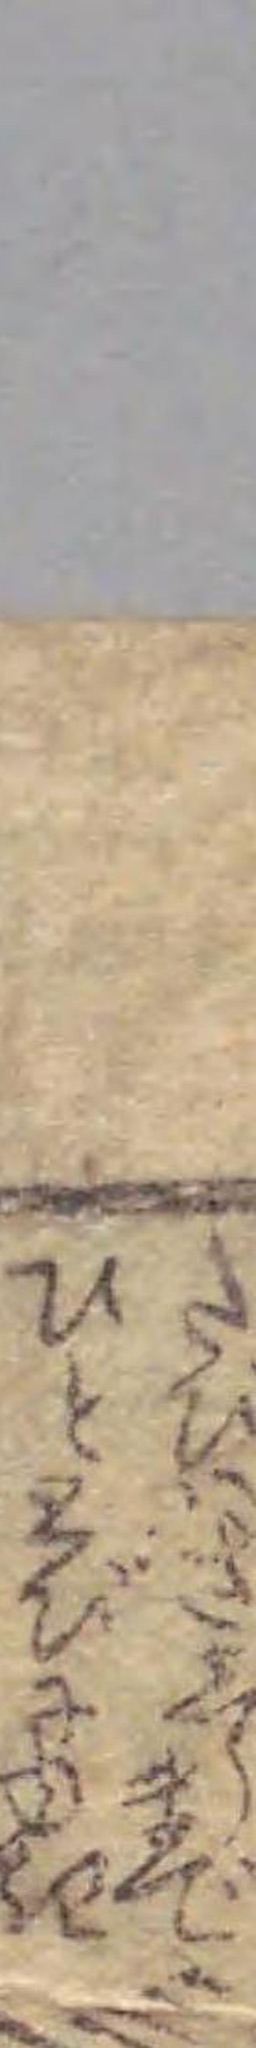ひととびにゆき
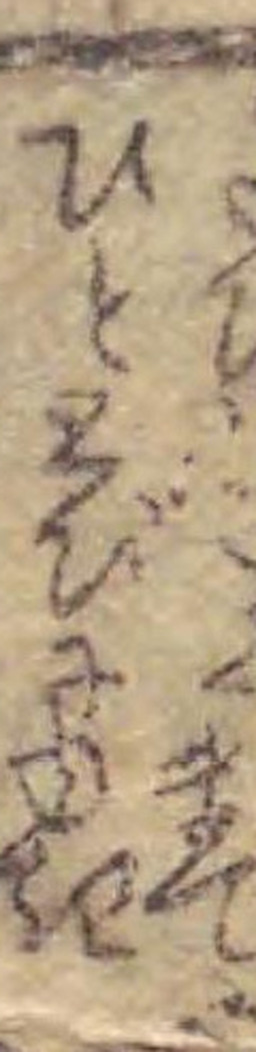ひととびにゆき
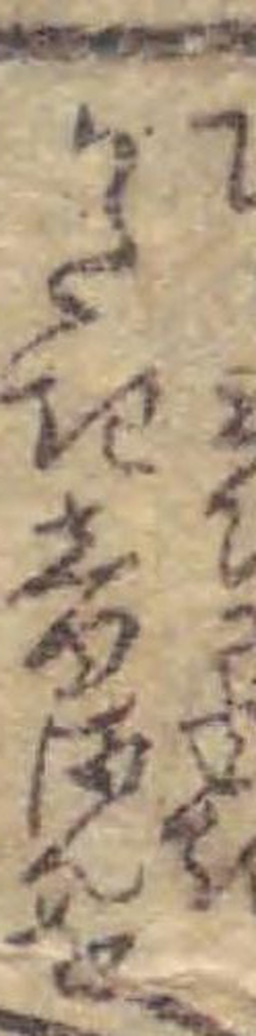かたきしゆはんを
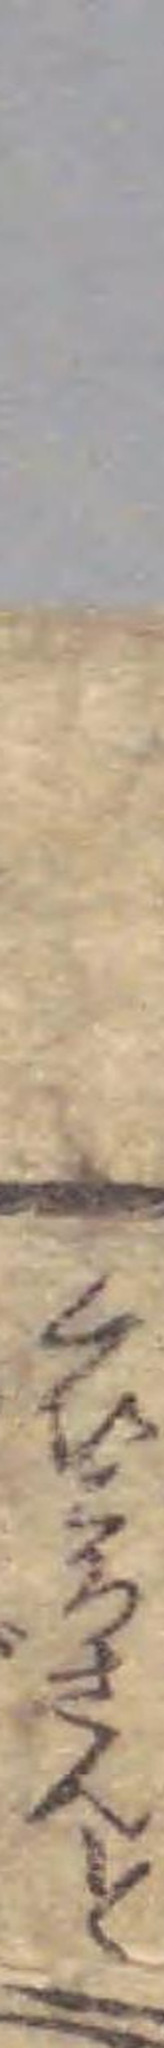くひころさんと
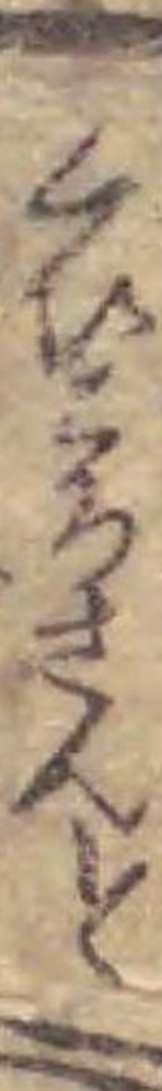くひころさんと
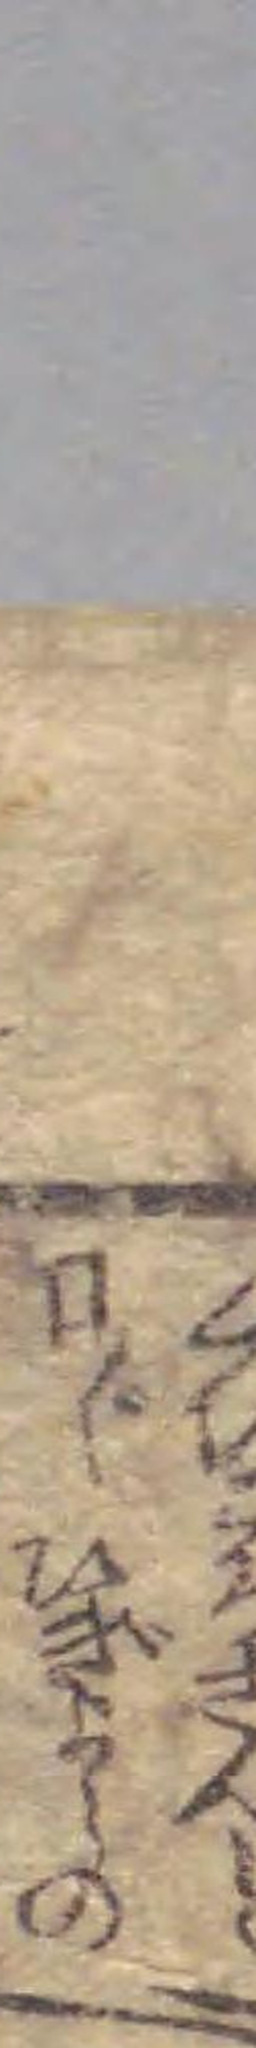日〴〵ひぎようの
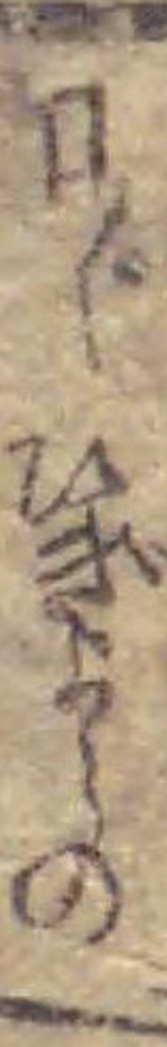日〴〵ひぎようの
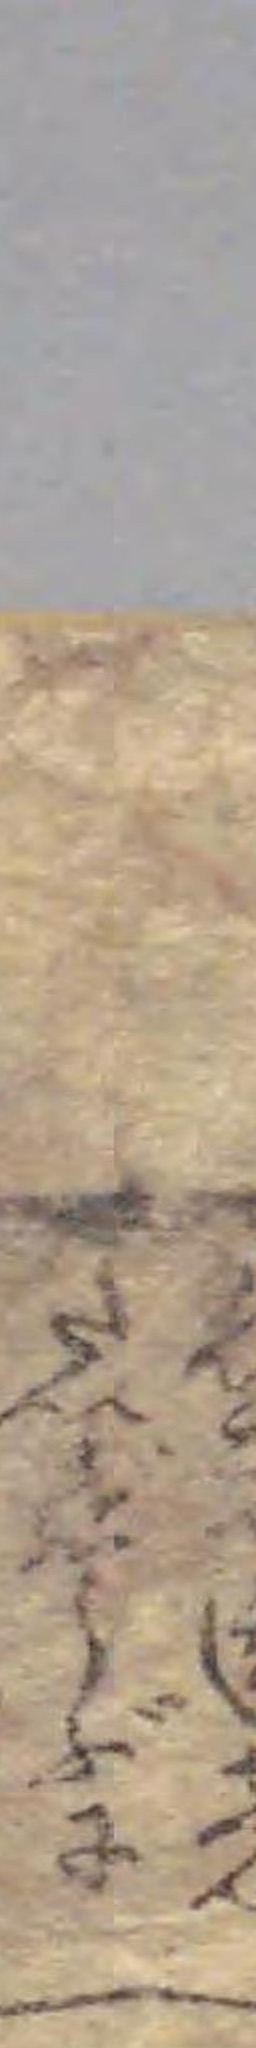たいじやうぶに
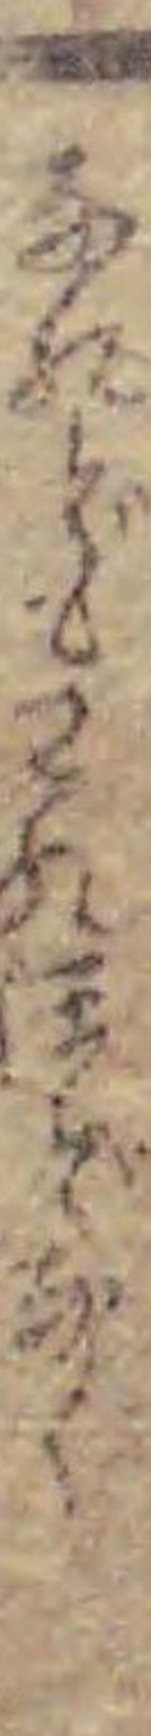なれどもわれほどなく
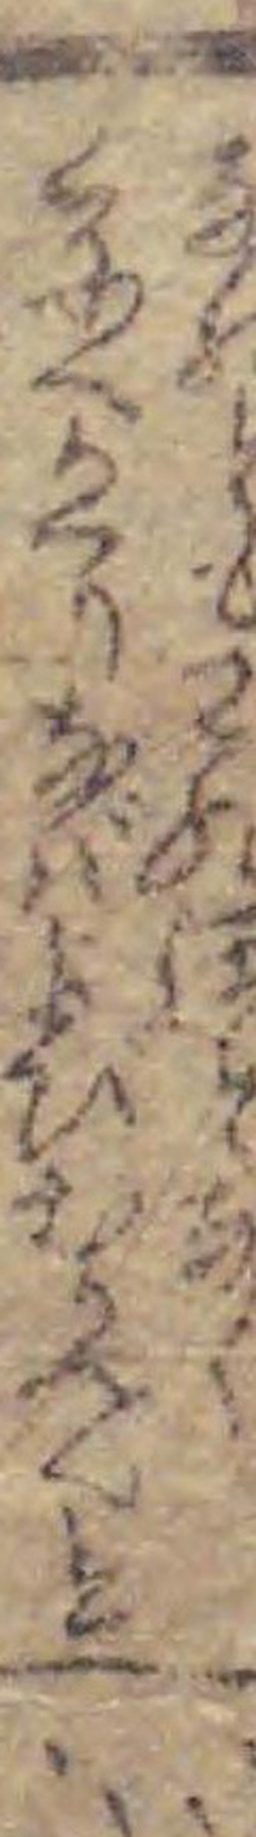くにへかへりなばよびむかへんと
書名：化物世界夜半嵐 : 3巻
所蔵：国立国会図書館 National Diet Library, JAPAN
